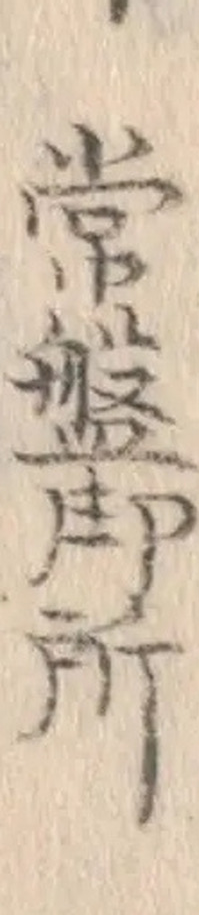常盤御所
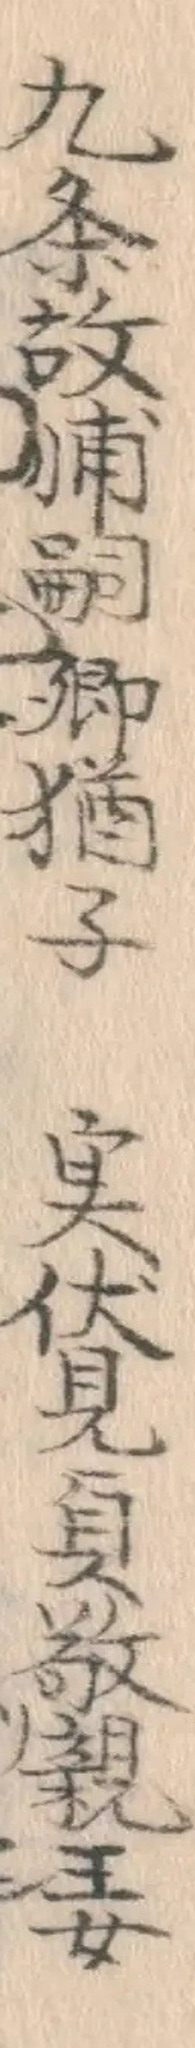九条故輔嗣卿猶子実伏見貞敬親王女
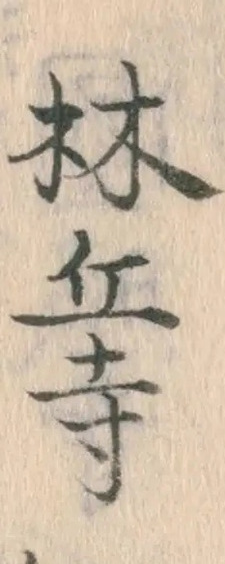林丘寺
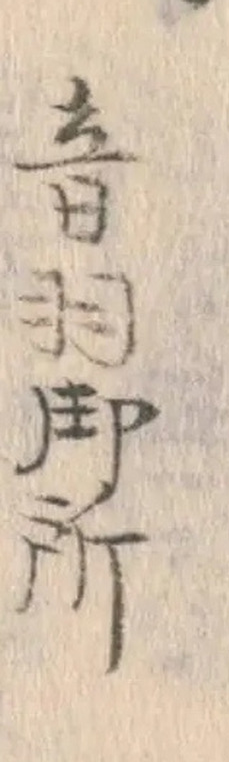音羽御所
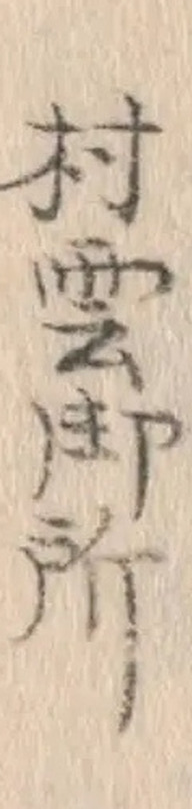村雲御所
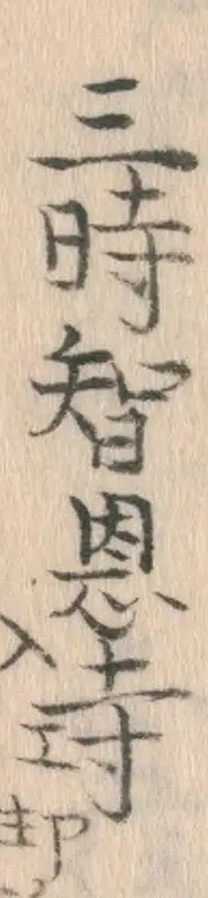三時智恩寺
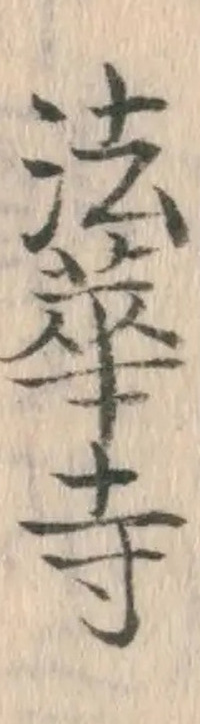法華寺
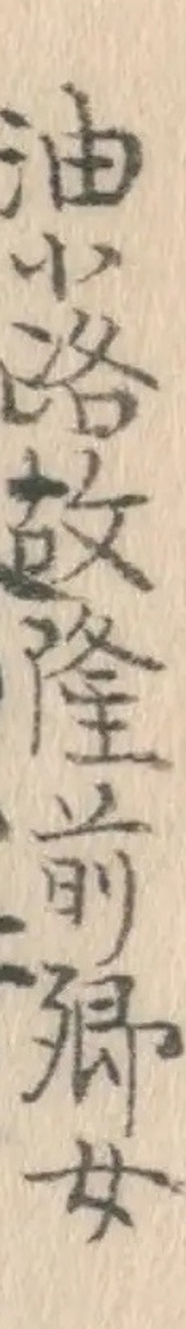油小路故隆前卿女藤
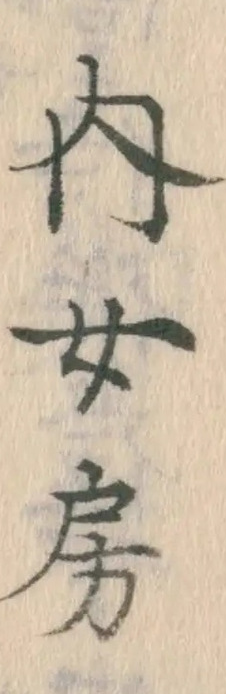内女房
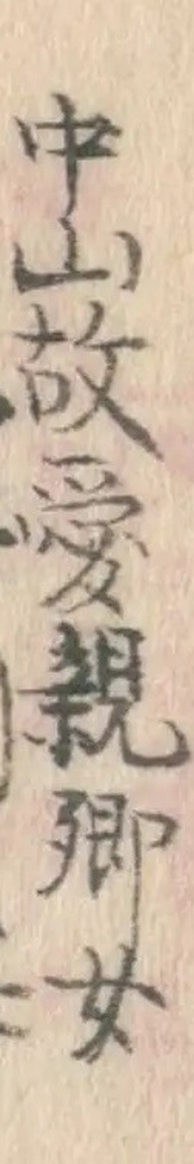中山故愛親卿女
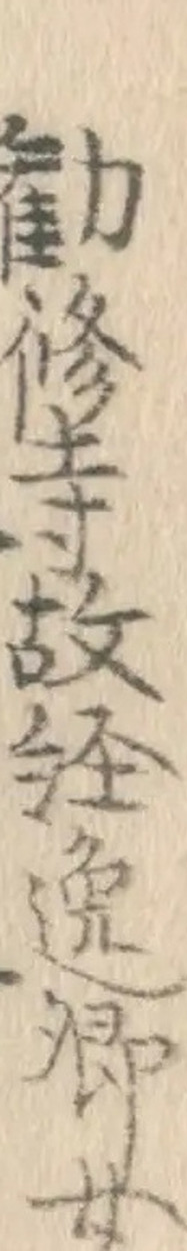勧修寺故経逸卿女

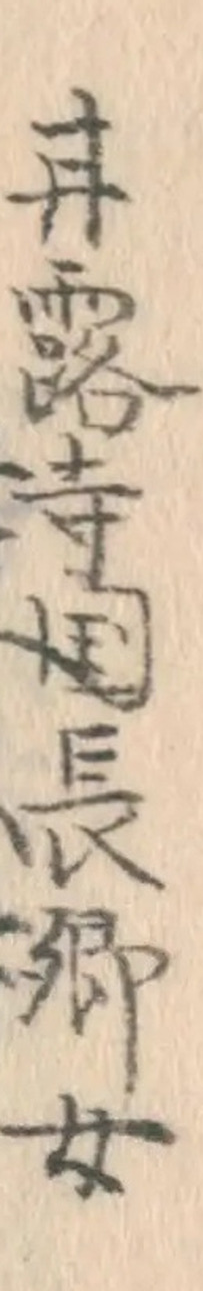甘露寺国長卿女
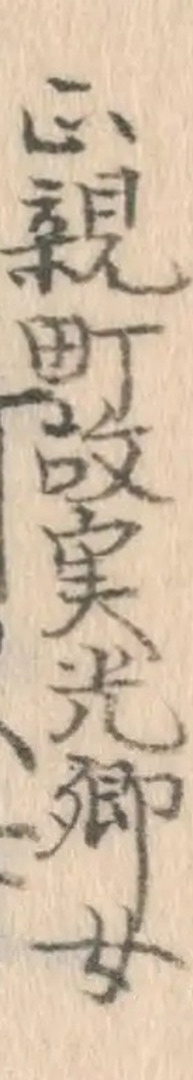正親町故実光卿女
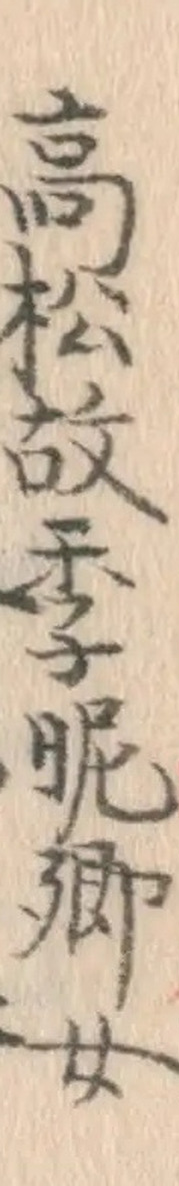高松故季昵卿女
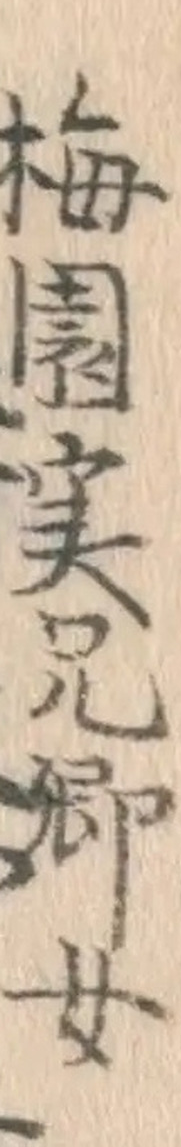梅園実兄卿女
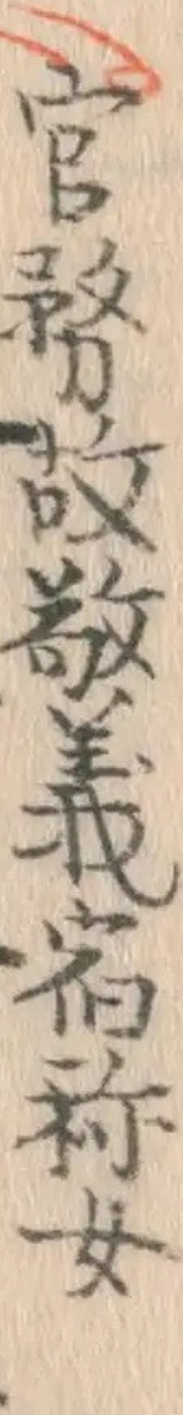◦官務故敬義宿称女
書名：賀茂社記録. 第80冊
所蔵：国立国会図書館 National Diet Library, JAPAN
